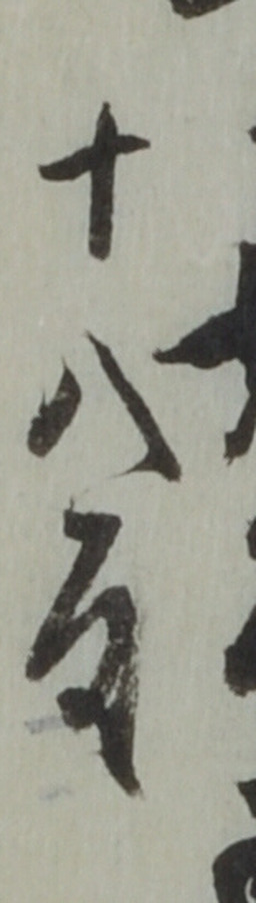十八反

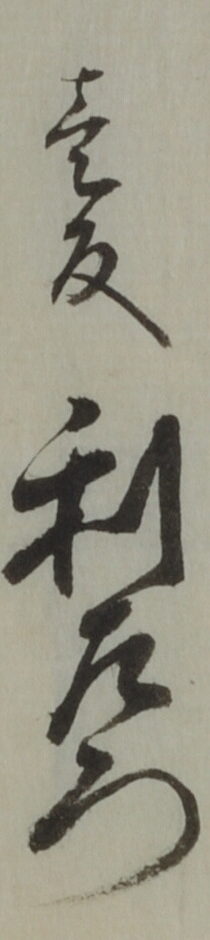壱反利左衛門
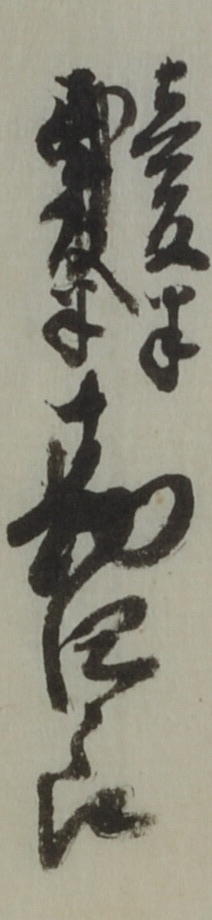壱反半勘四郎
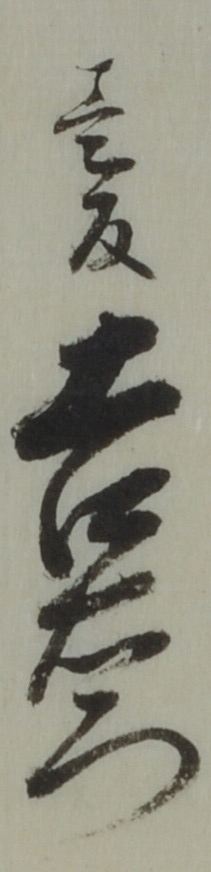壱反市郎右衛門
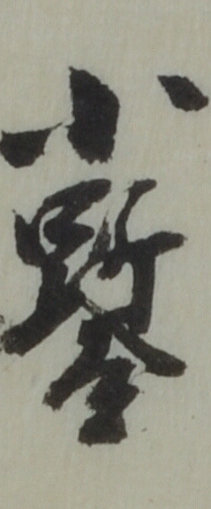小野屋
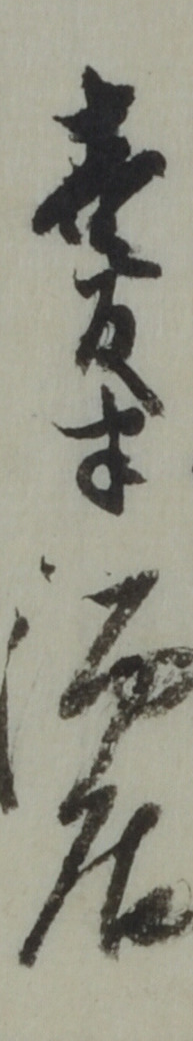壱反半酒店

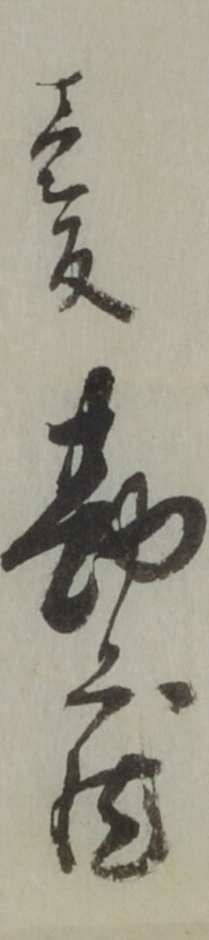壱反勘蔵
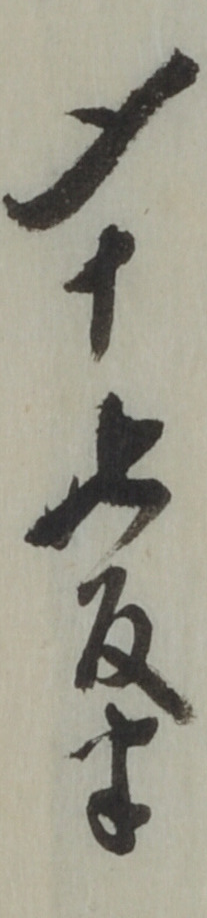〆十七反半
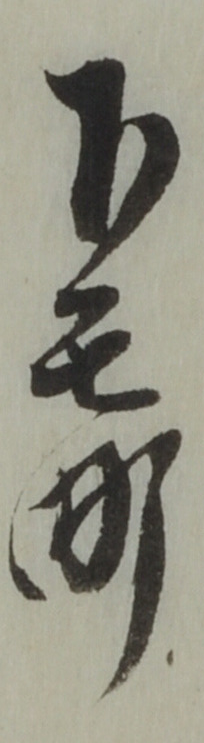下モ町
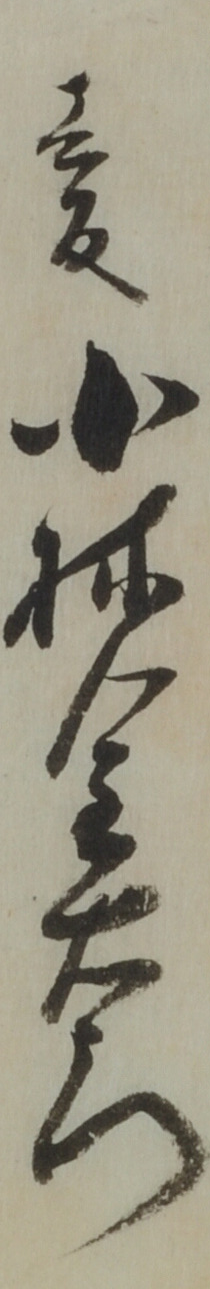壱反小林金右衛門
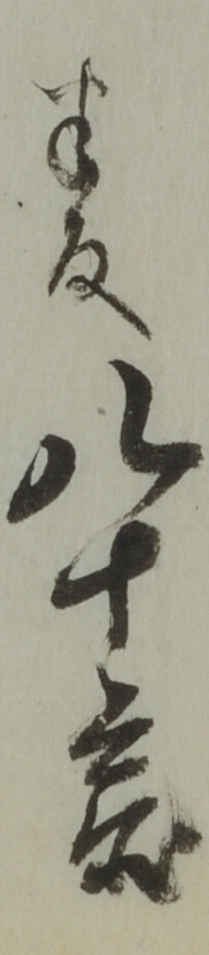半反八十兵衛
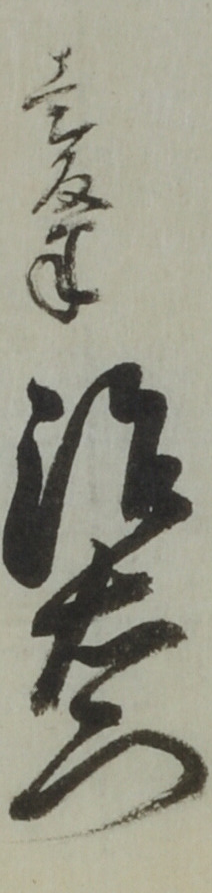壱反半治右衛門

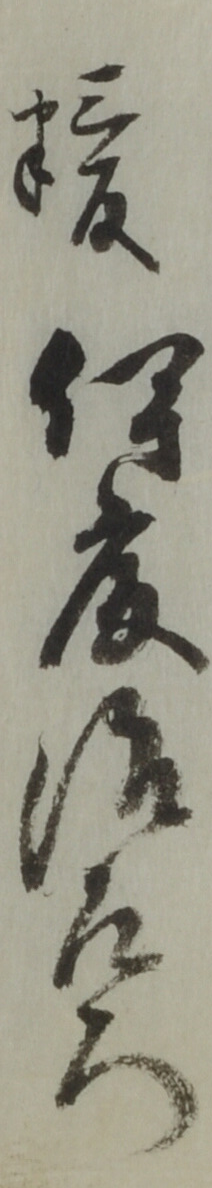三反伊藤治左衛門
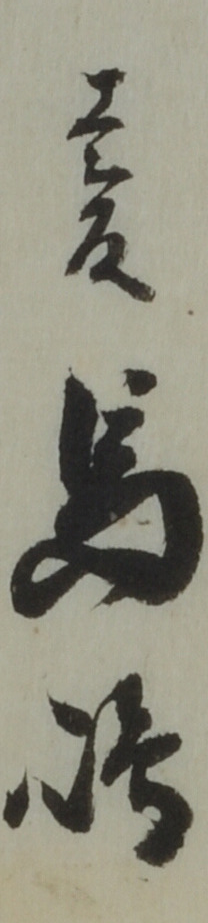壱反馬島
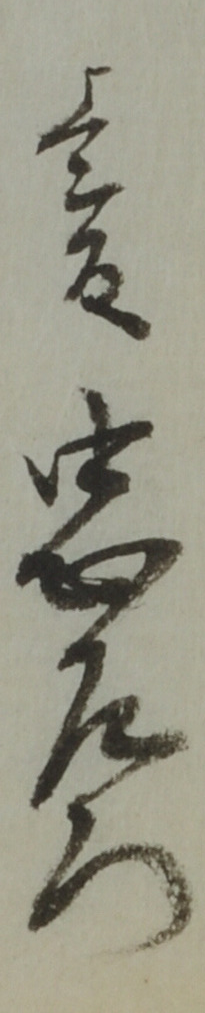壱反忠左衛門

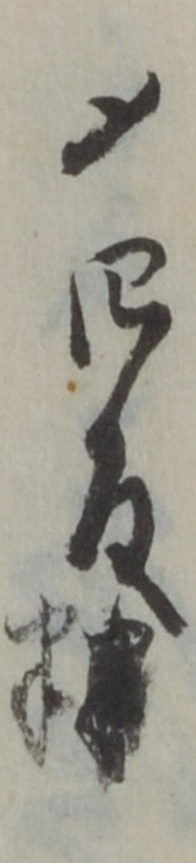〆五反
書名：融通割合帳
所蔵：伊那市立高遠町図書館・合同会社AMANE
